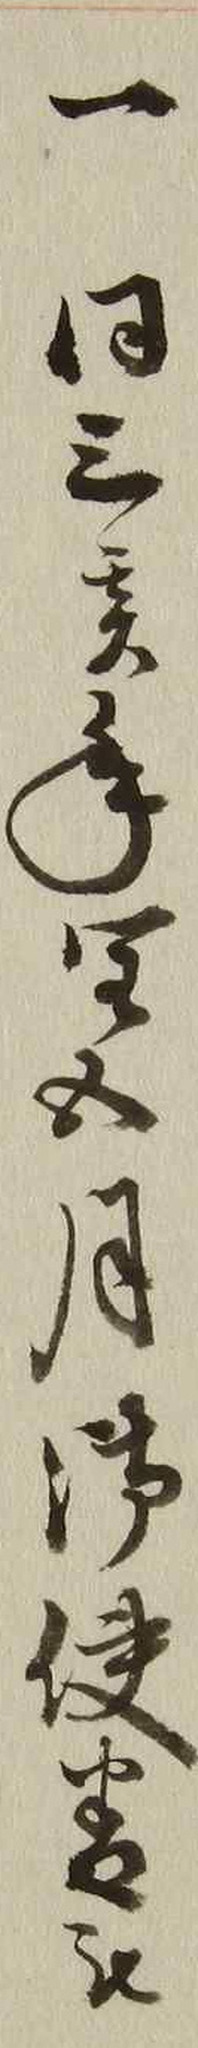一同三亥年閏五月御使番被
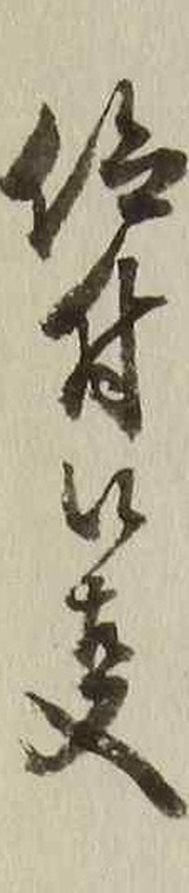仰付候事
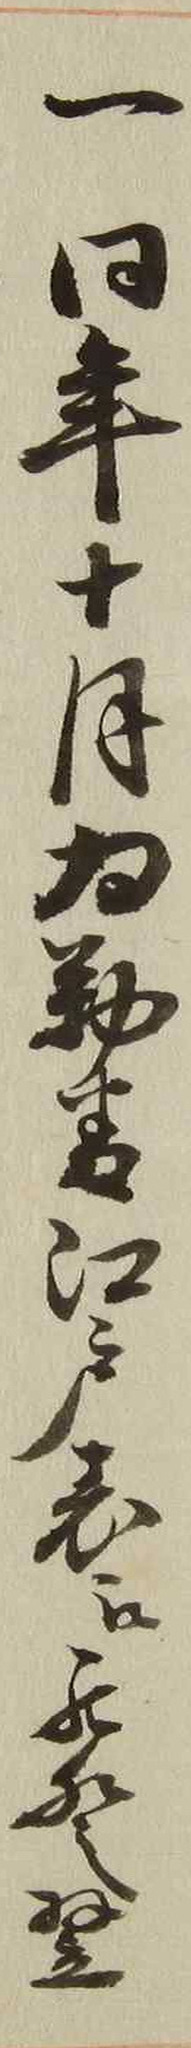一同年十月為勤番江戸表江罷登翌
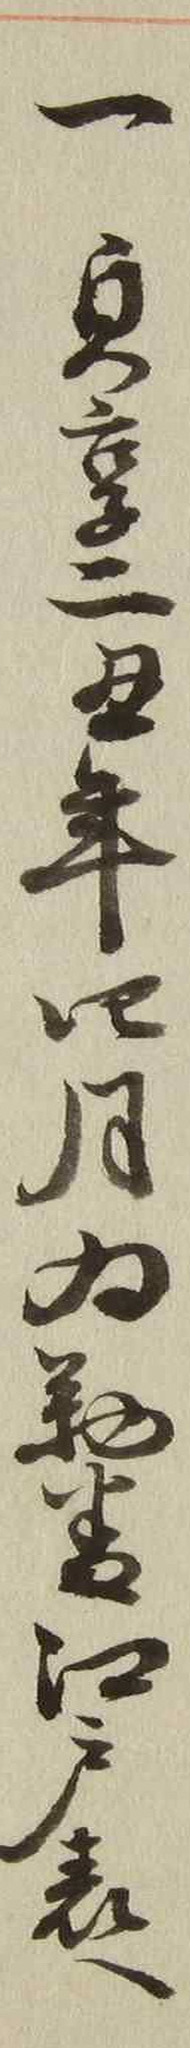一貞享二丑年四月為勤番江戸表へ
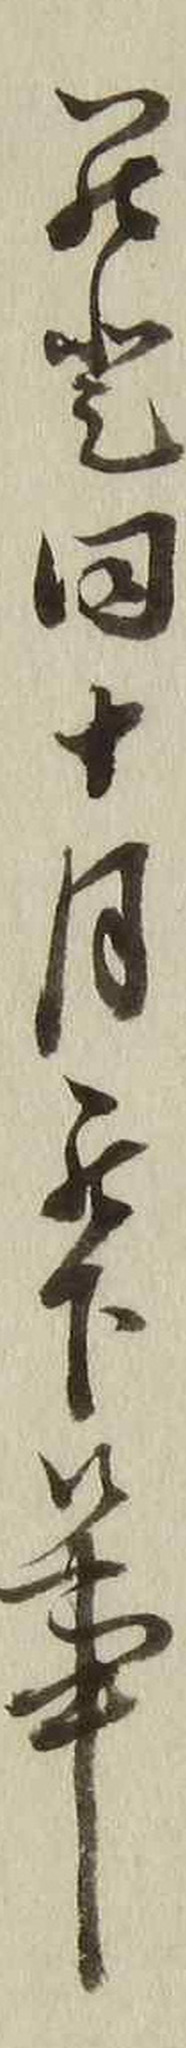罷登同十月罷下候事
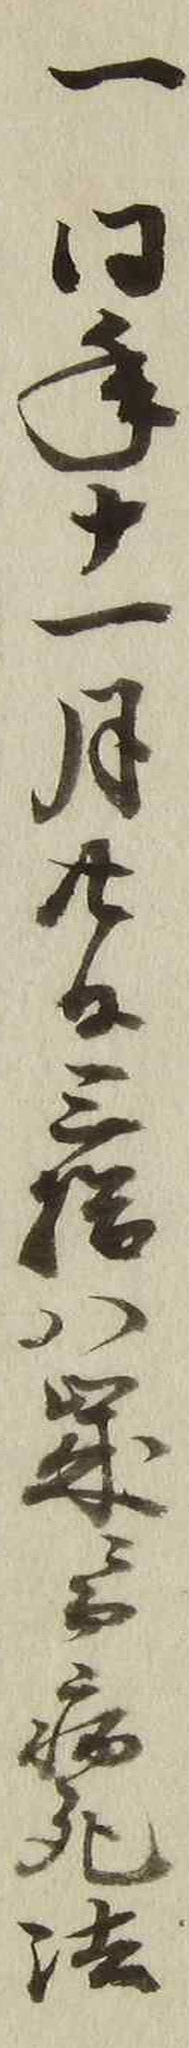一同年十一月廿日三拾八歳ニ而病死法
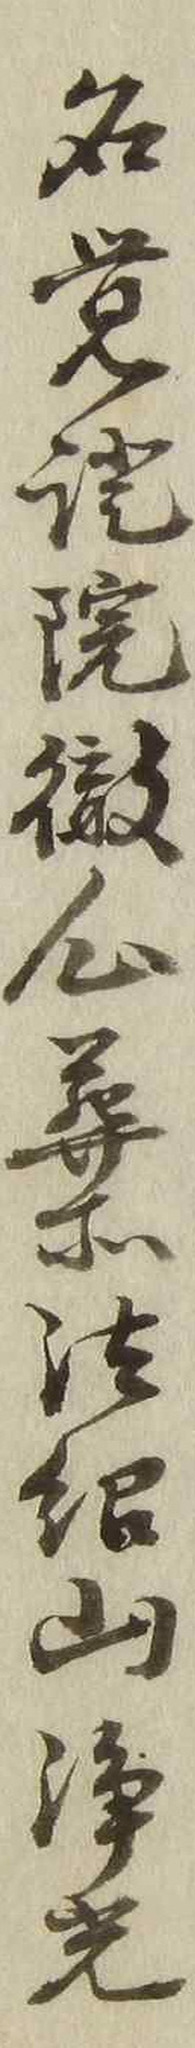名覚證院徹心葬所法紹山浄光
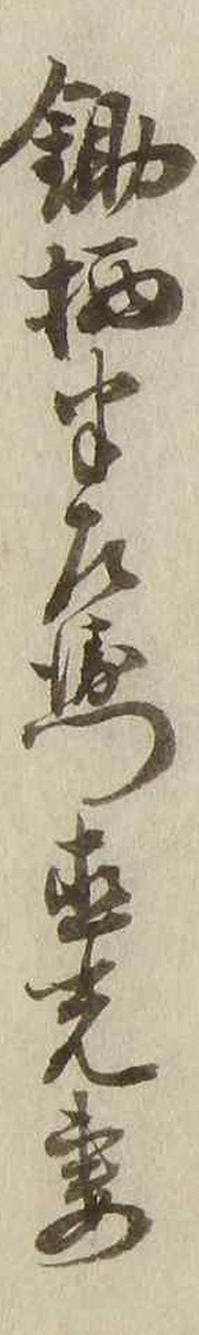女鋤柄半左衛門直光妻
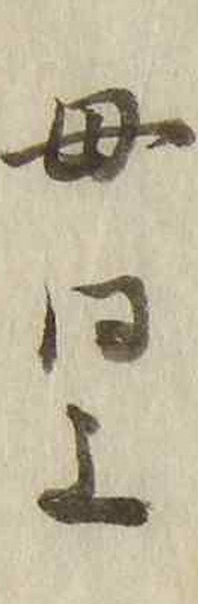母同上

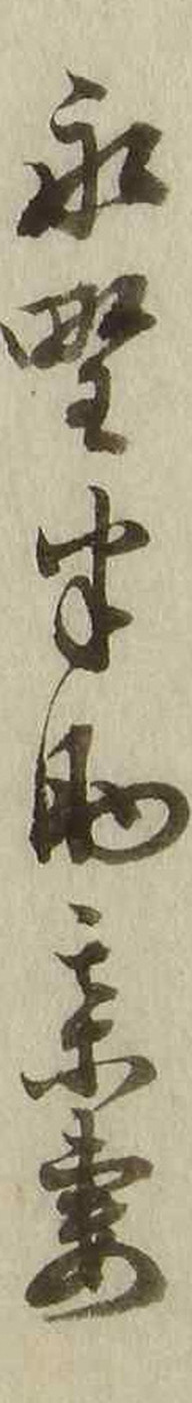女永野半助某妻
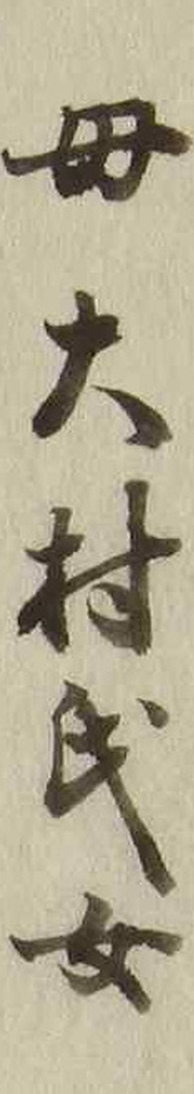母大村氏女
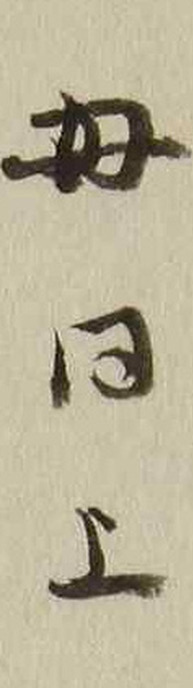母同上
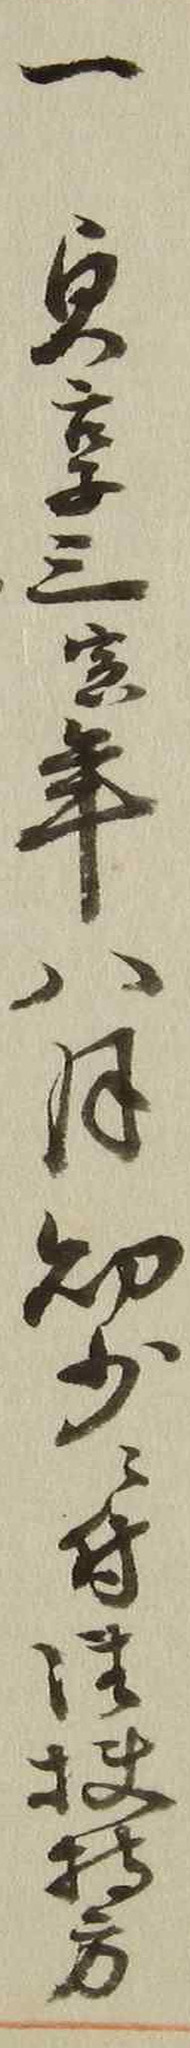一貞享三寅年八月幼少ニ付御扶持方
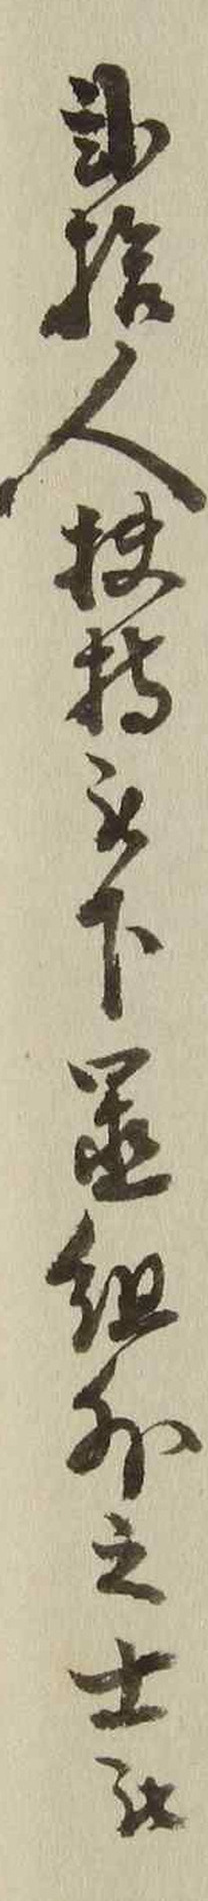弐拾人扶持被下置組外之士被
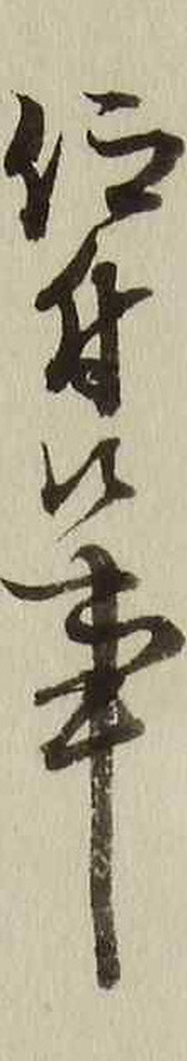仰付候事
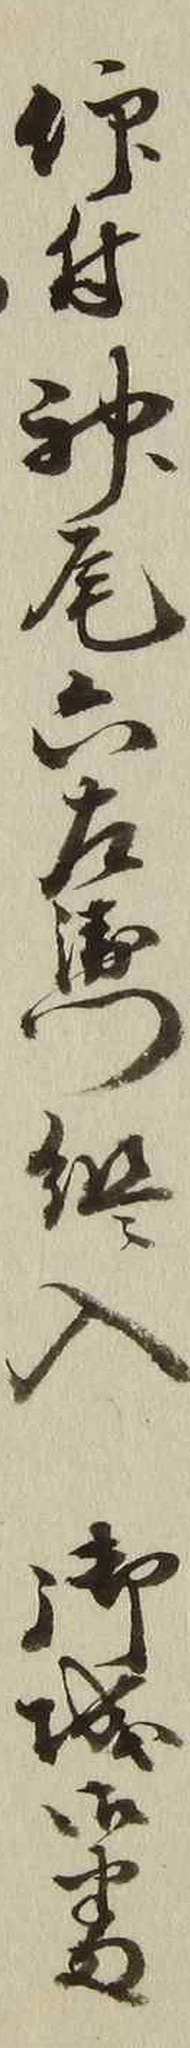仰付神尾六左衛門組ニ入御城御番
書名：諸士系譜　巻之31　い之部31
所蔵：会津若松市立会津図書館
